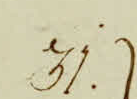31.
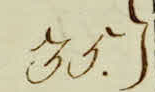35.
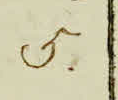5.
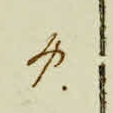4.
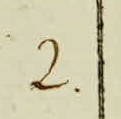2.
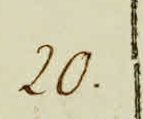20.
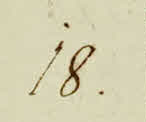18.
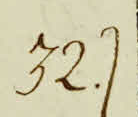32.
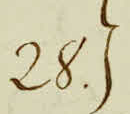28.
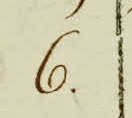6.
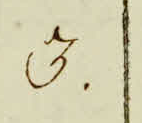3.
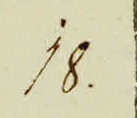18.
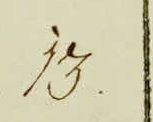13.
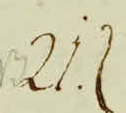21.
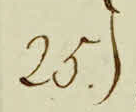25.
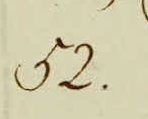52.
